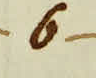6
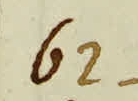62
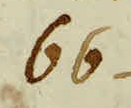66
